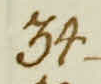34
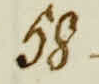58
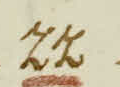22
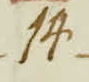14
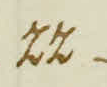22
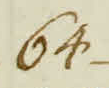64
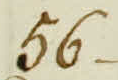56
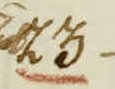23
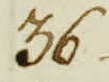36
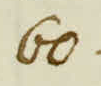60
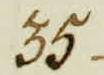35
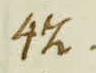42
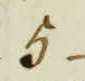5
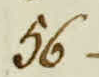56
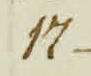17
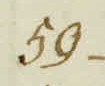59
